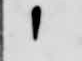1
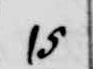15
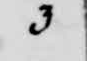3
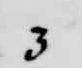3
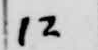12
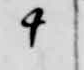4
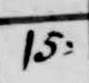15
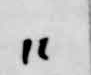11
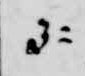3
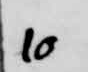10
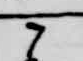7
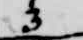3
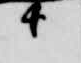4
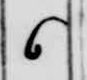6
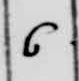6
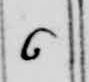6
